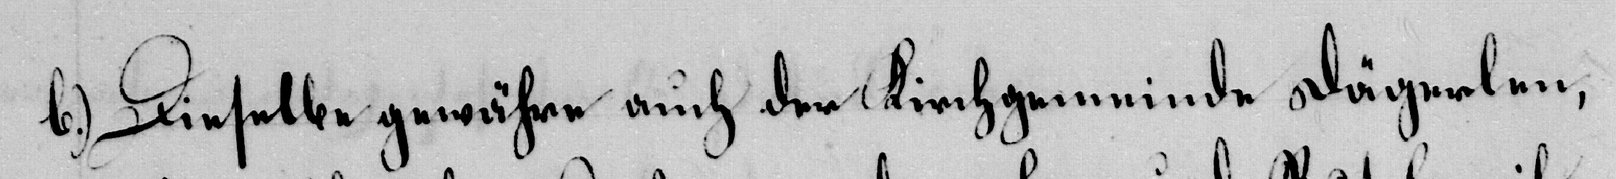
b.) Dieselbe gewähre auch der Kirchgemeinde Dägerlen,
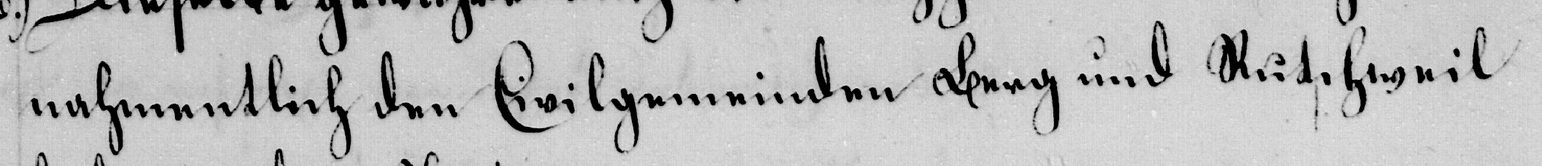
nahmentlich den Civilgemeinden Berg und Rutschweil
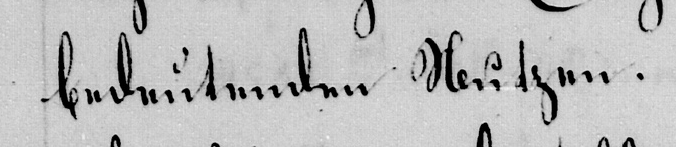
bedeutenden Nutzen.
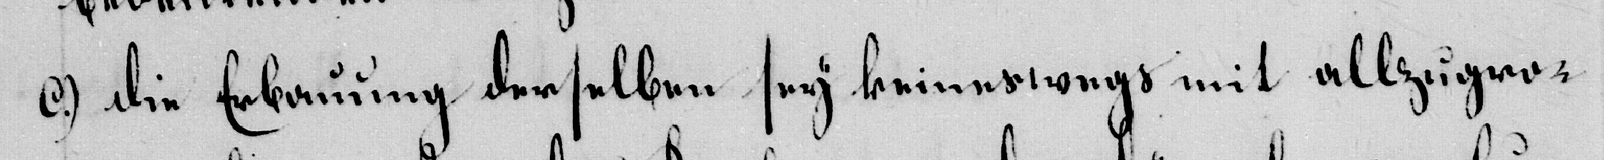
c.) die Erklärung derselben sey keineswegs mit allzugro¬
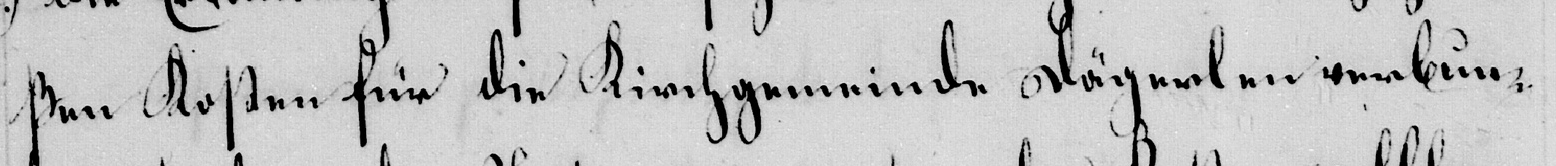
ßen Kosten für die Kirchgemeinde Dägerlen verbun¬
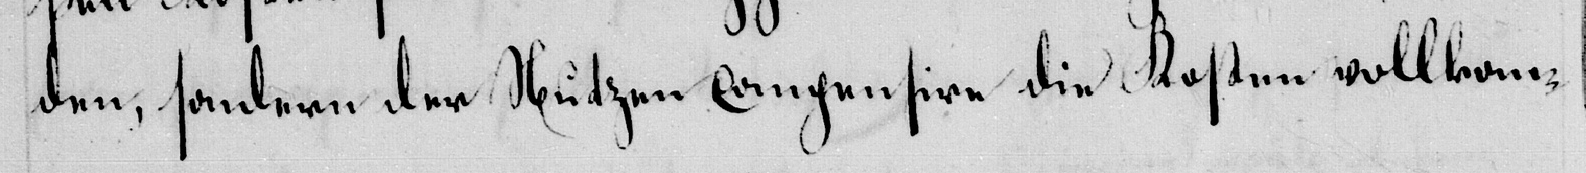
den, sondern der Nutzen compensire die Kosten vollkom¬
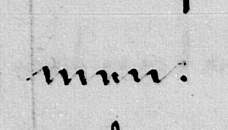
men.
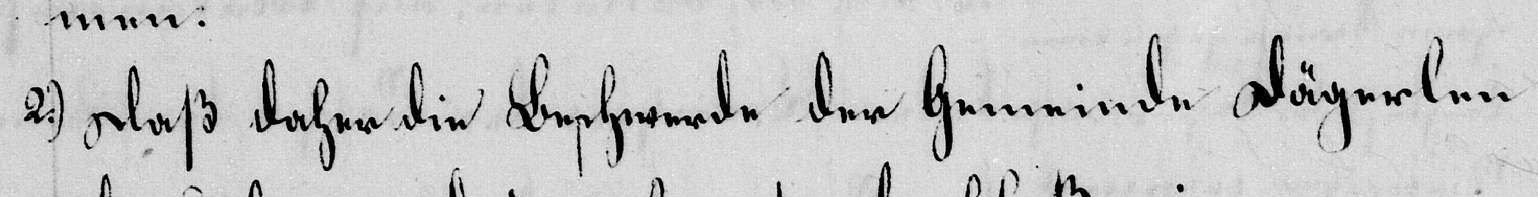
2.) daß daher die Beschwerde der Gemeinde Dägerlen
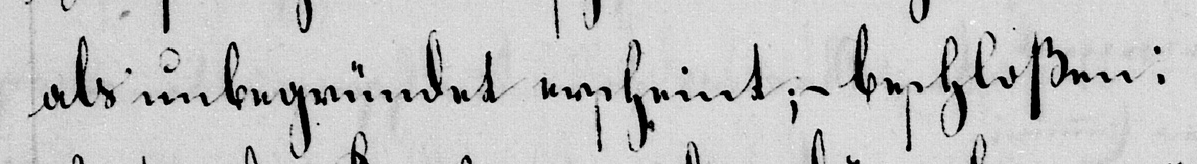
als unbegründet erscheint, – beschloßen:
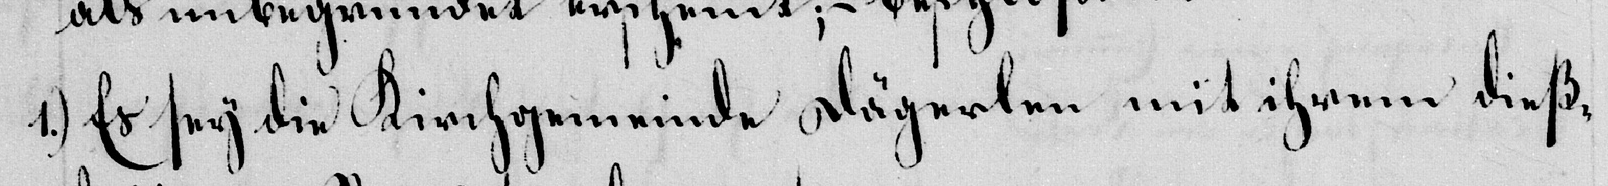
1.) Es sey die Kirchgemeinde Dägerlen mit ihrem dieß¬
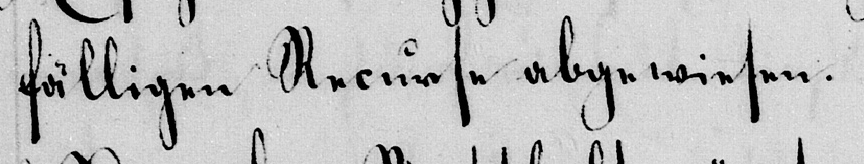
fälligen Recurse abgewiesen.
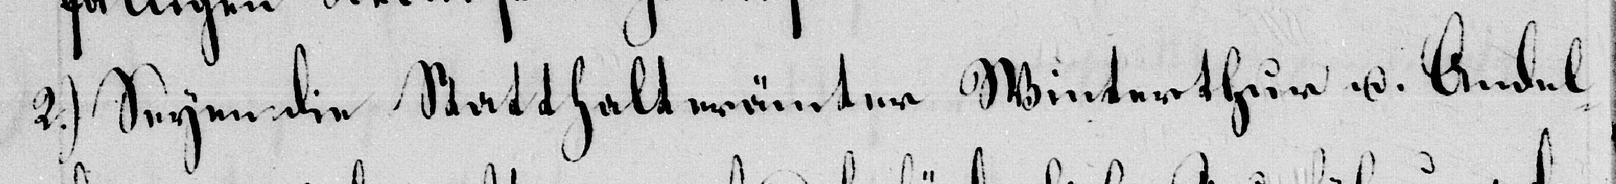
2.) Seyen die Statthalterämter Winterthur u. Andel¬
